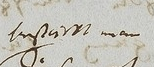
bestärkt man
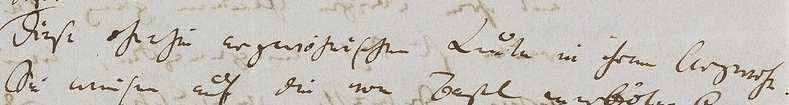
diese ohnehin argwöhnischen Leute in ihrem Argwohn.
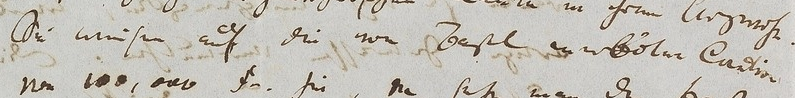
Sie weisen auf die von Basel anerbotne Caution
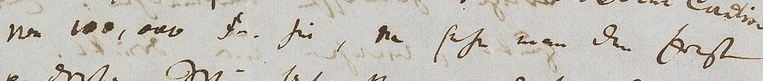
von 100,000 Fr. hin, da sehe man den Ernst
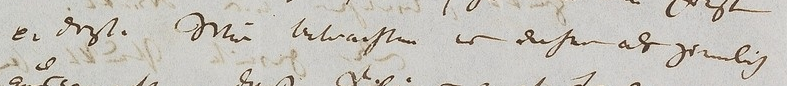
&. drgl. Wir betrachten es daher als ziemlich
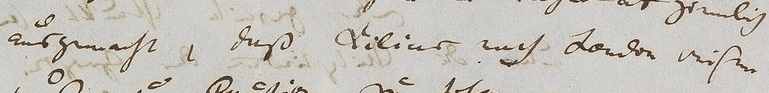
ausgemacht, daß Kilias nach London reisen
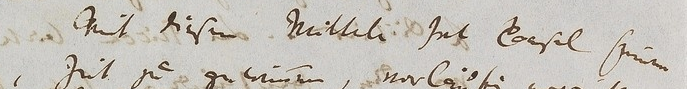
Mit diesen Mitteln hat Basel seinen
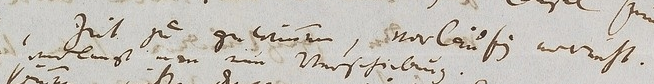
Zeit zu gewinnen, vorläufig erreicht.
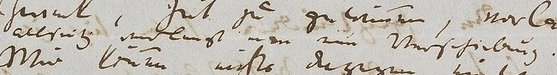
Allseitig verlangt man eine Verschiebung.
